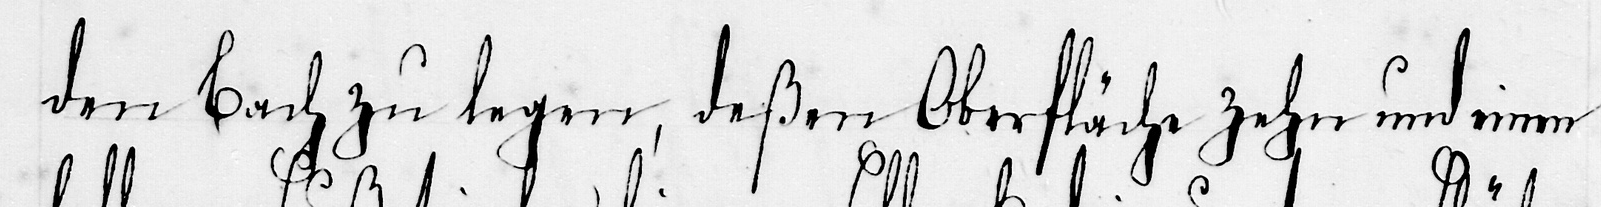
den Bach zu legen, deßen Oberfläche zehn und einen
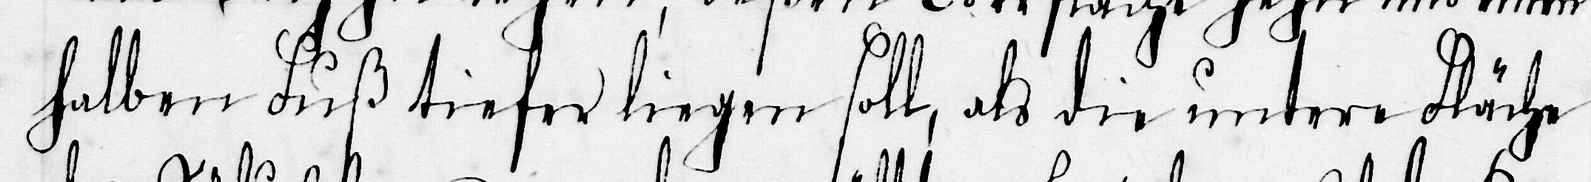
halben Fuß tiefer liegen soll, als die untere Fläche
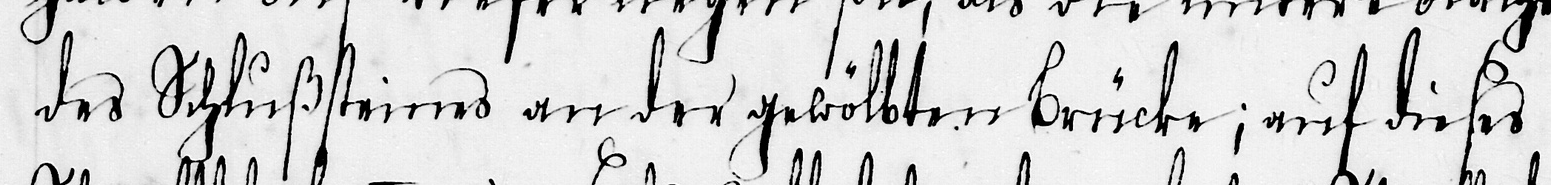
des Schlußsteines an der gewölbten Brücke; auf dieses
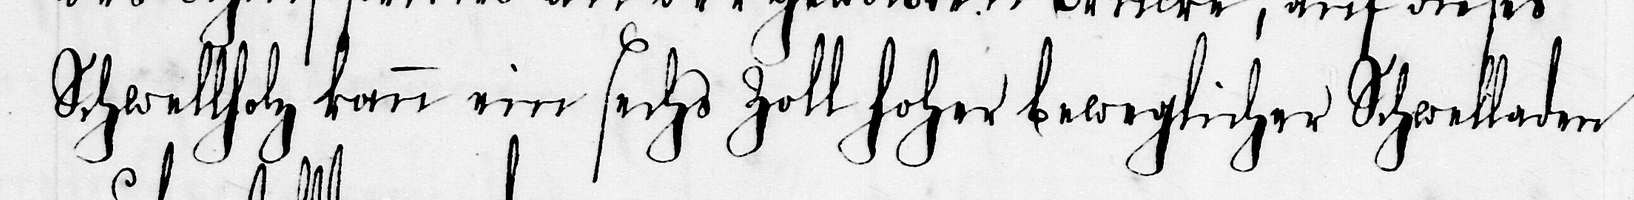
Schwellholz kann ein sechs Zoll hoher beweglicher Schwelladen
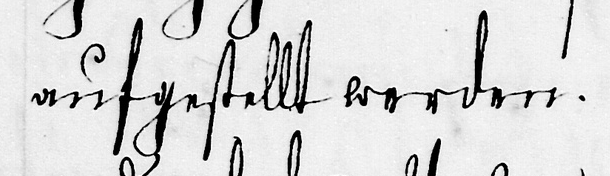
aufgestellt werden.
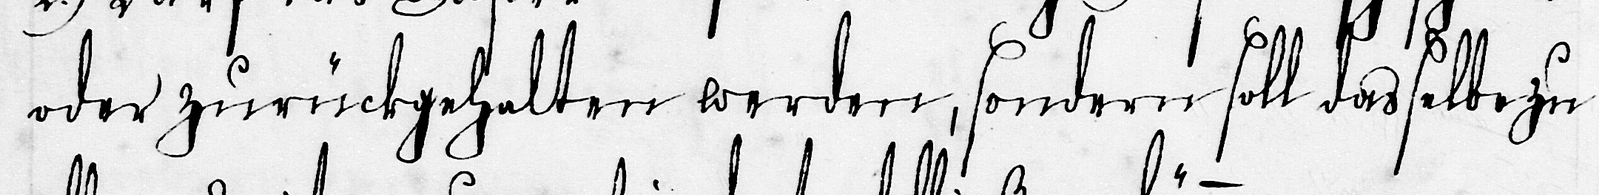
oder zurückgehalten werden, sondern soll dasselbe zu
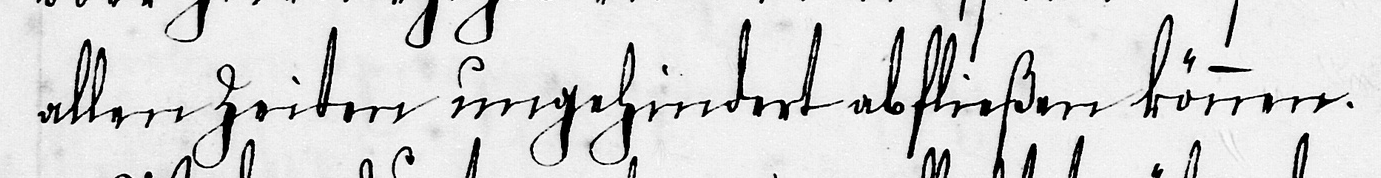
allen Zeiten ungehindert abfließen können.
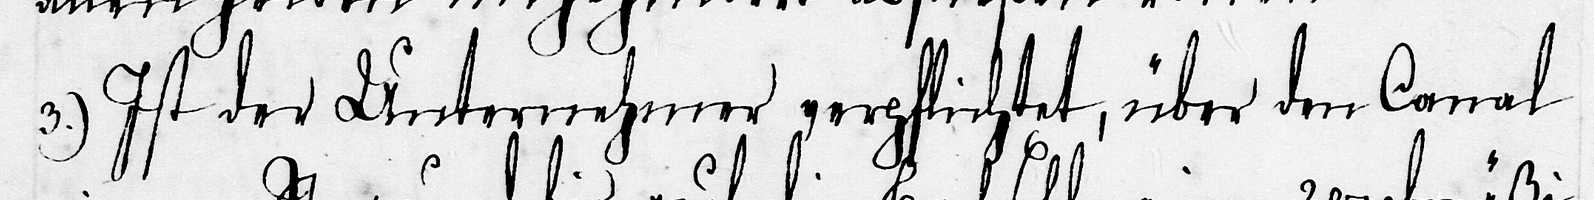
3.) Ist der Unternehmer verpflichtet, über den Canal
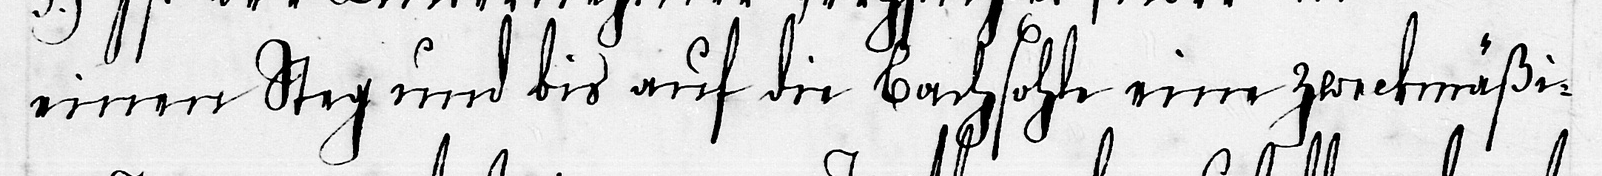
einen Steg und bis auf die Bachsohle eine zweckmäßi¬
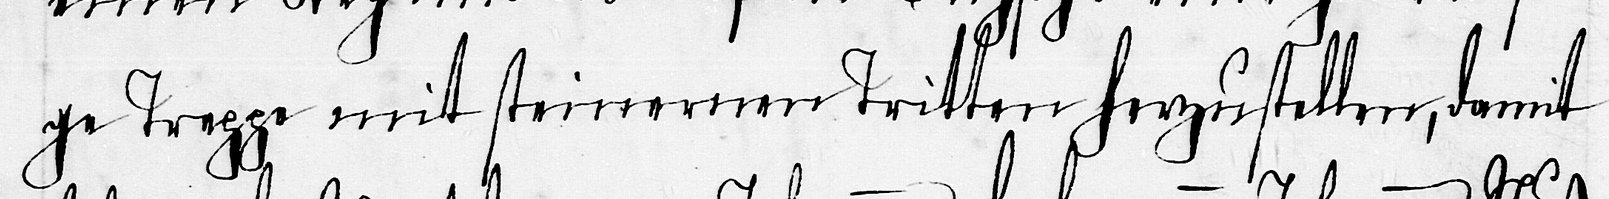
ge Treppe mit steinernen Tritten herzustellen, damit
